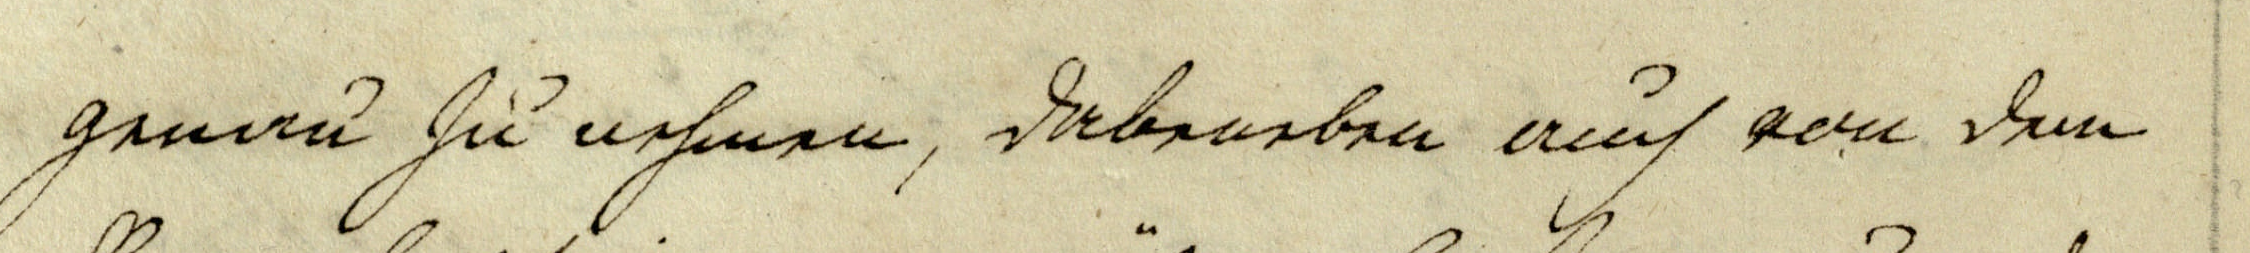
genau zu nehmen, dabeneben auch von dem
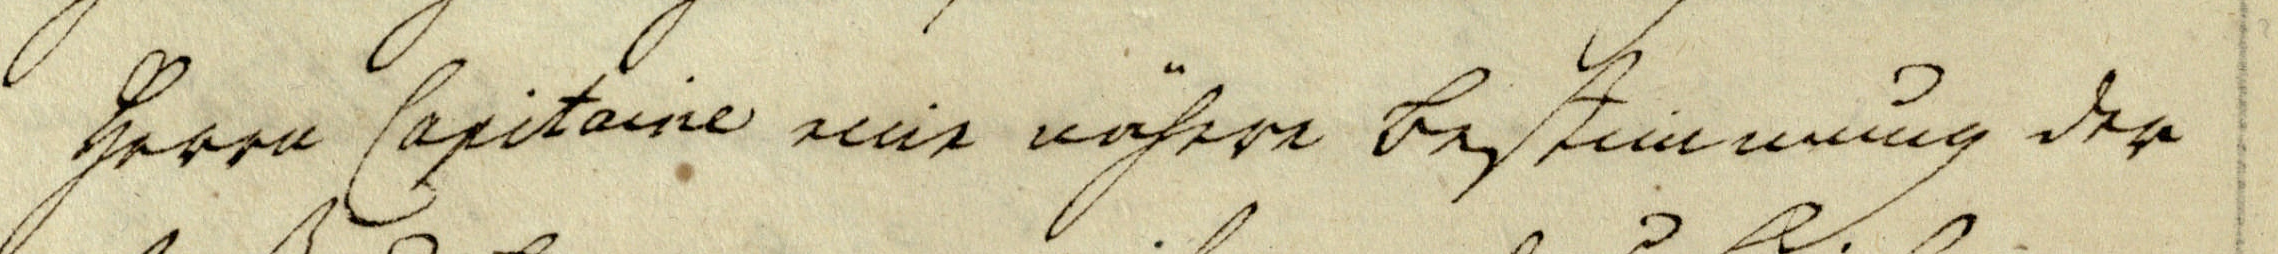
Herrn Capitaine eine nähere Bestimmung der
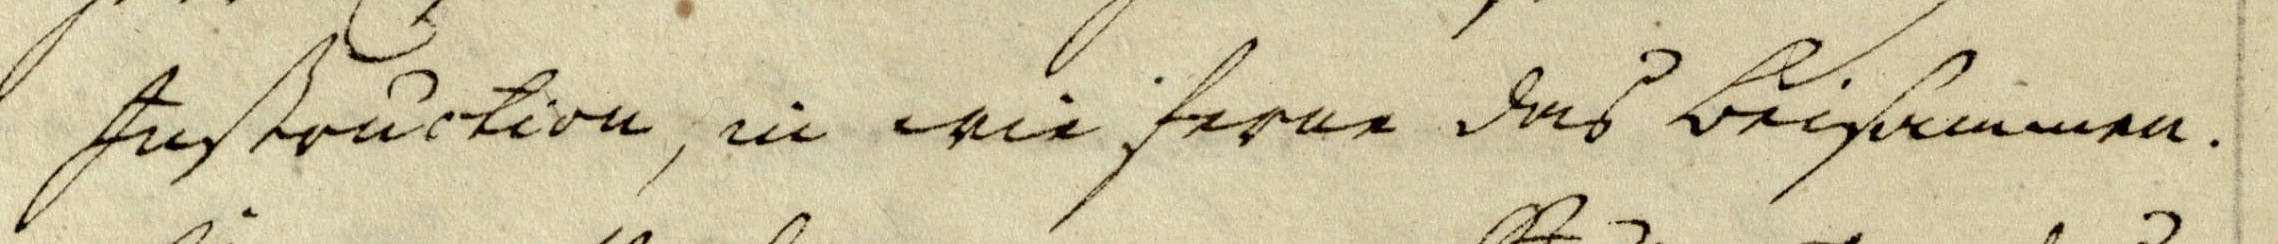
Instruction, in wie ferne das Beisammen¬
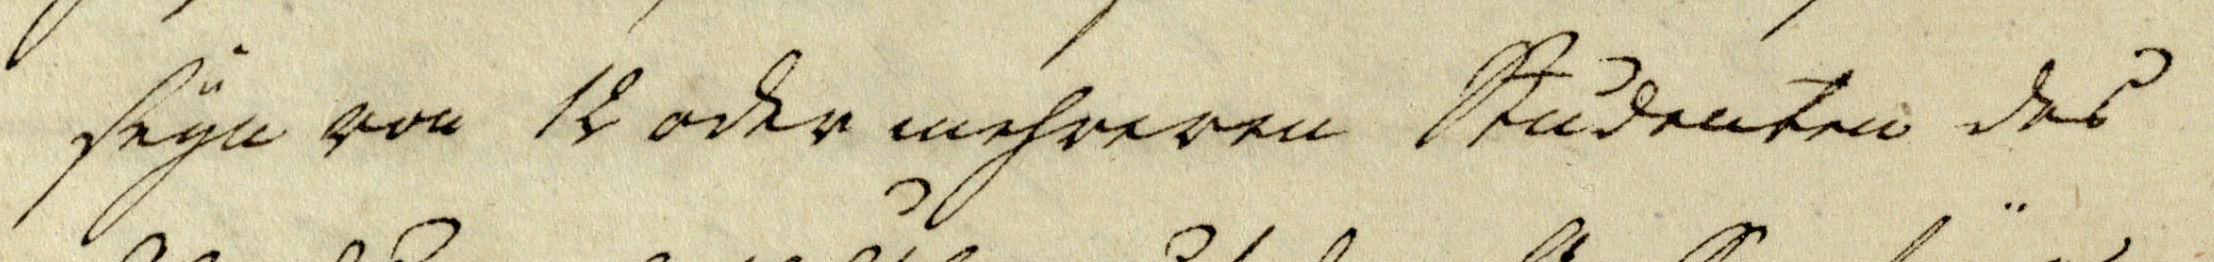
seÿn von 12 oder mehreren Studenten des
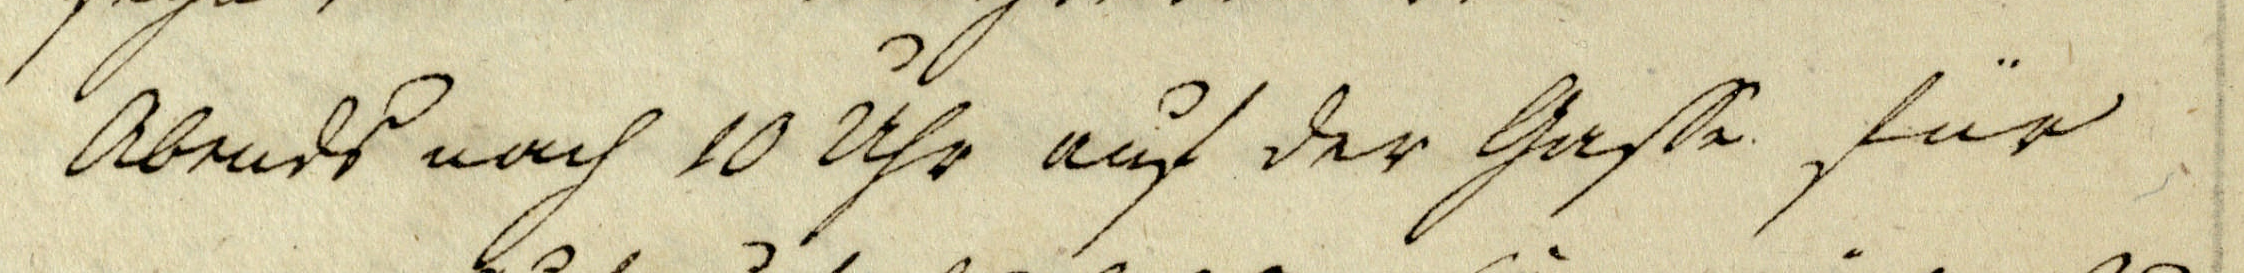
Abends nach 10 Uhr auf der Gasse für
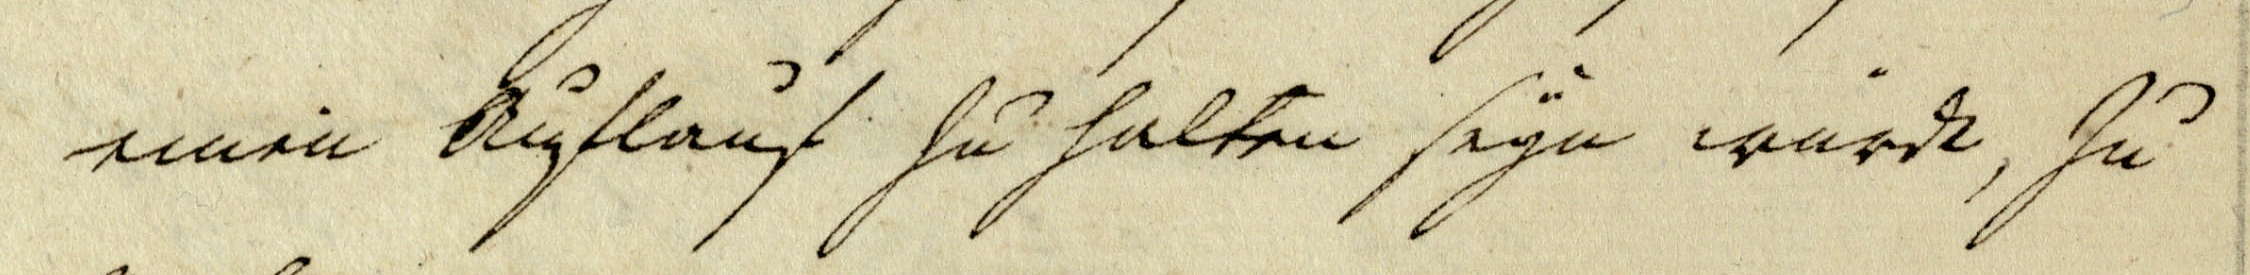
einen Auflauf zu halten seÿn würde, zu
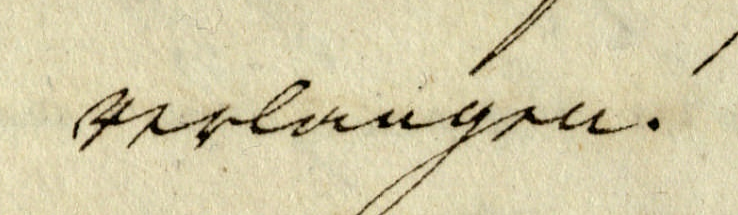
verlangen.
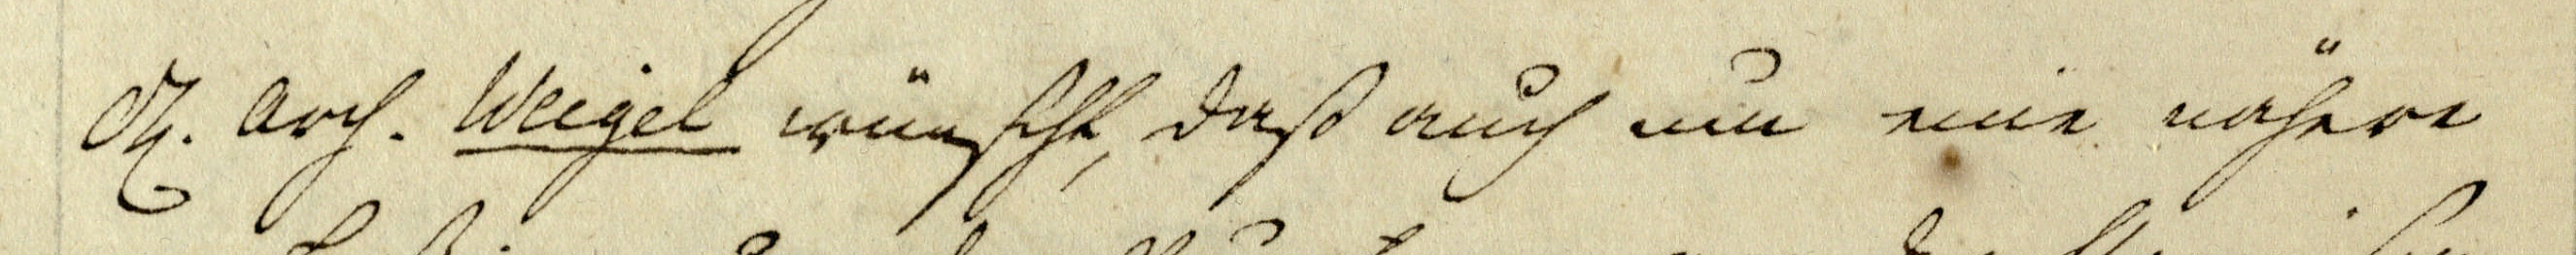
dh. Arch. Weigel wünscht, daß auch um eine nähere
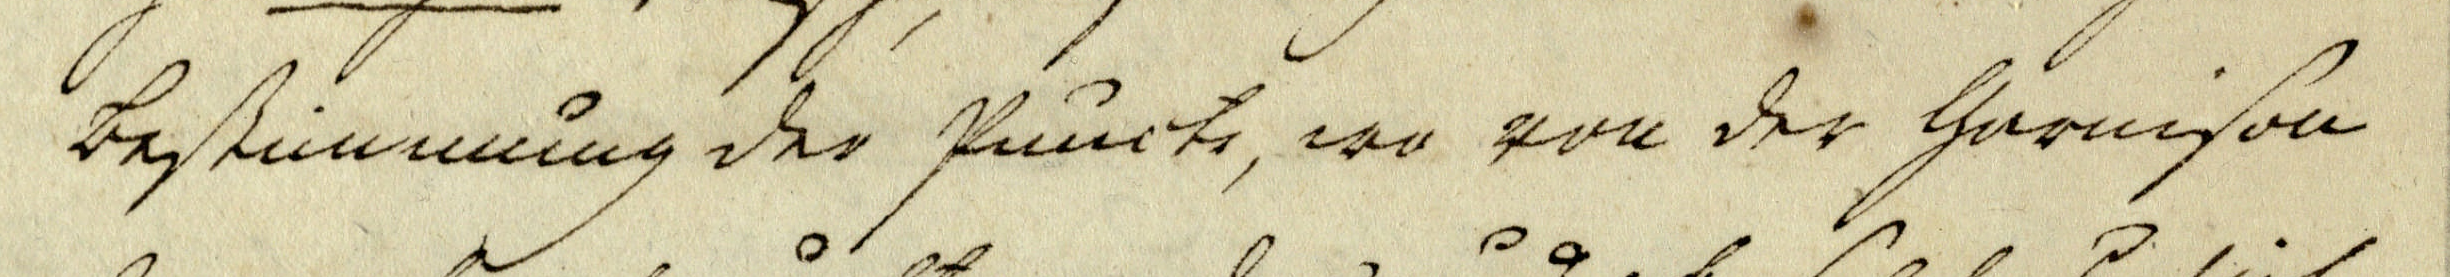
Bestimmung der Puncte, wo von der Garnison
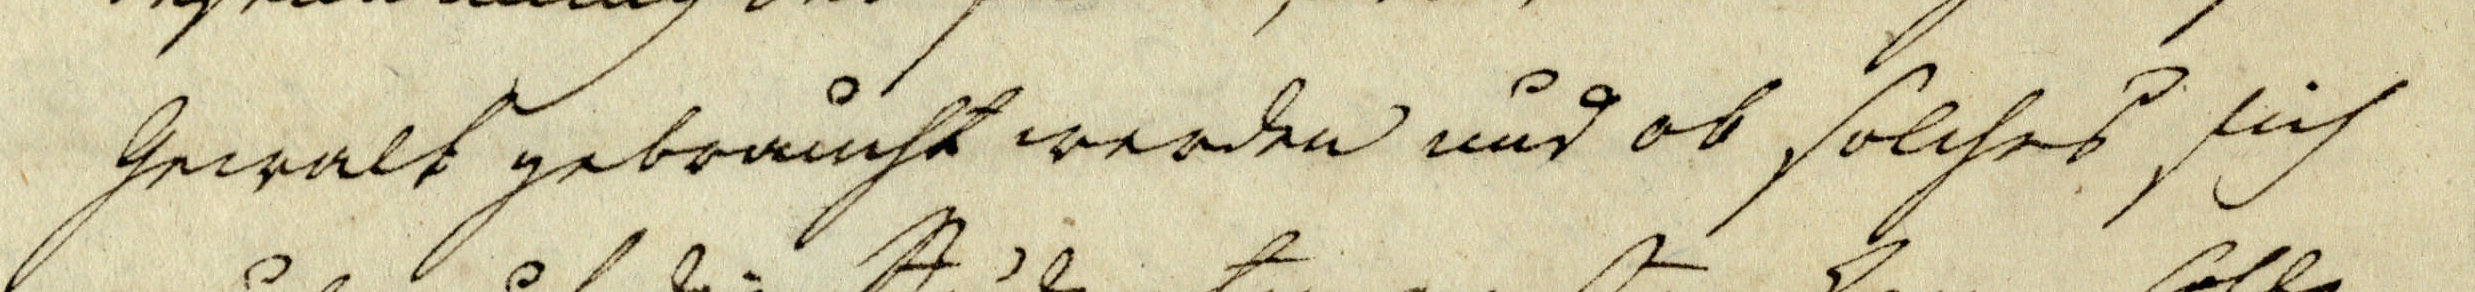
Gewalt gebraucht werden und ob solches sich
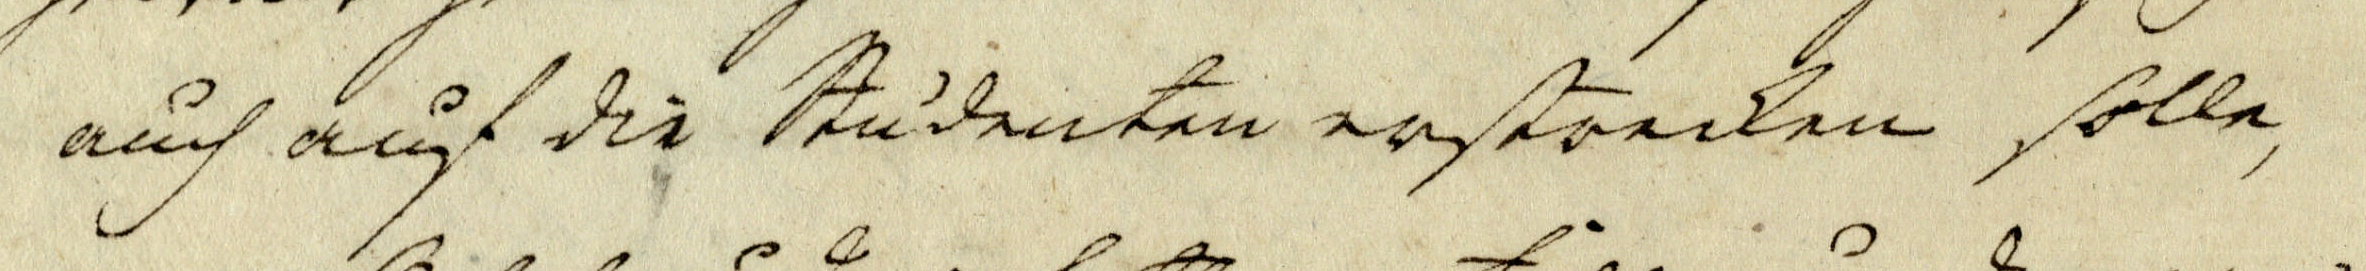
auch auf die Studenten erstrecken solle,
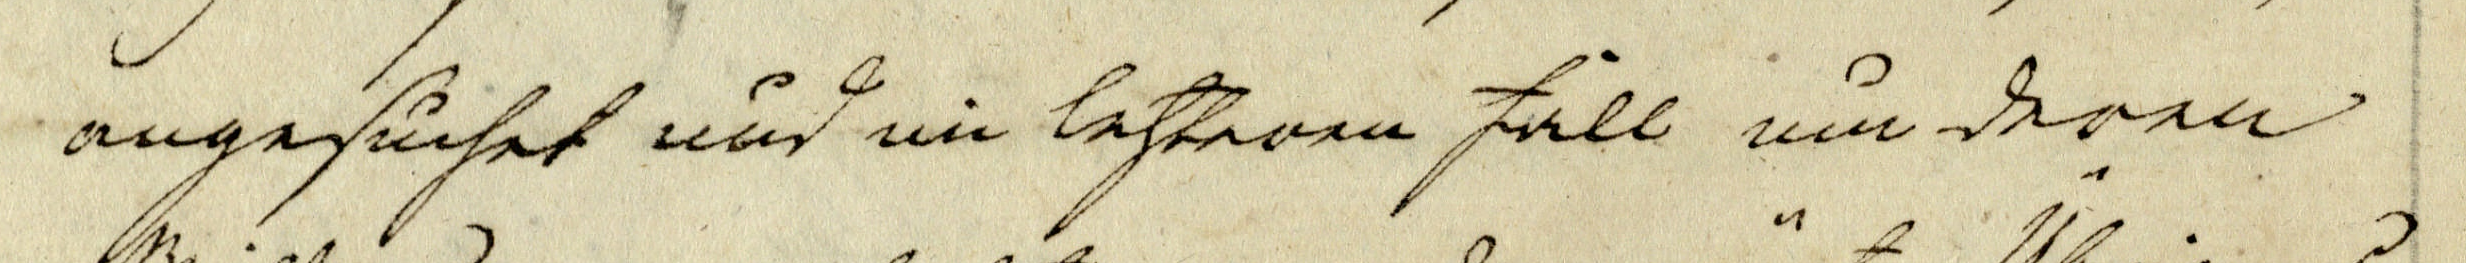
angesuchet und in letzteren Fall um deren
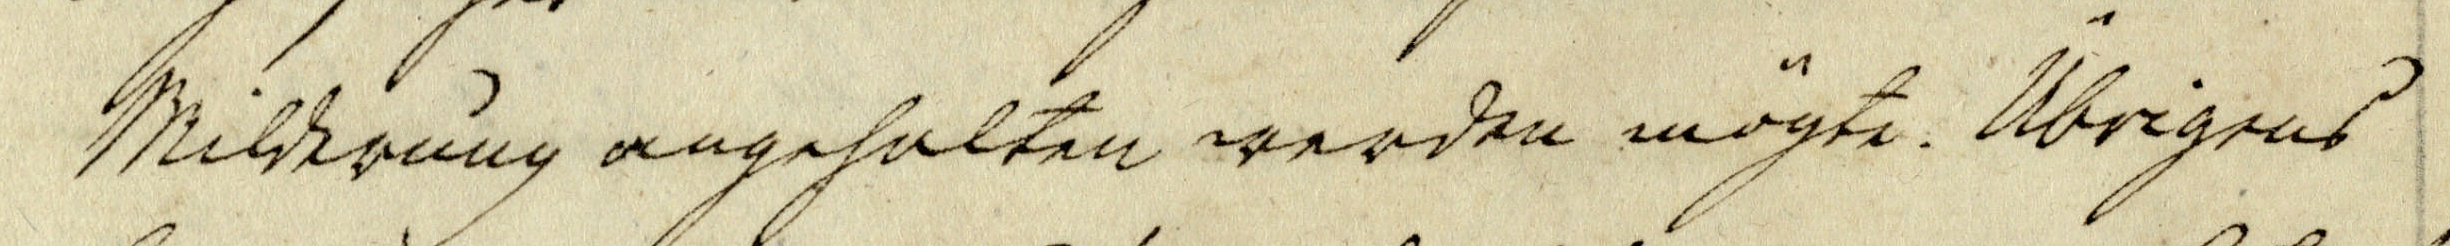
Milderung angehalten werden mögte. Übrigens
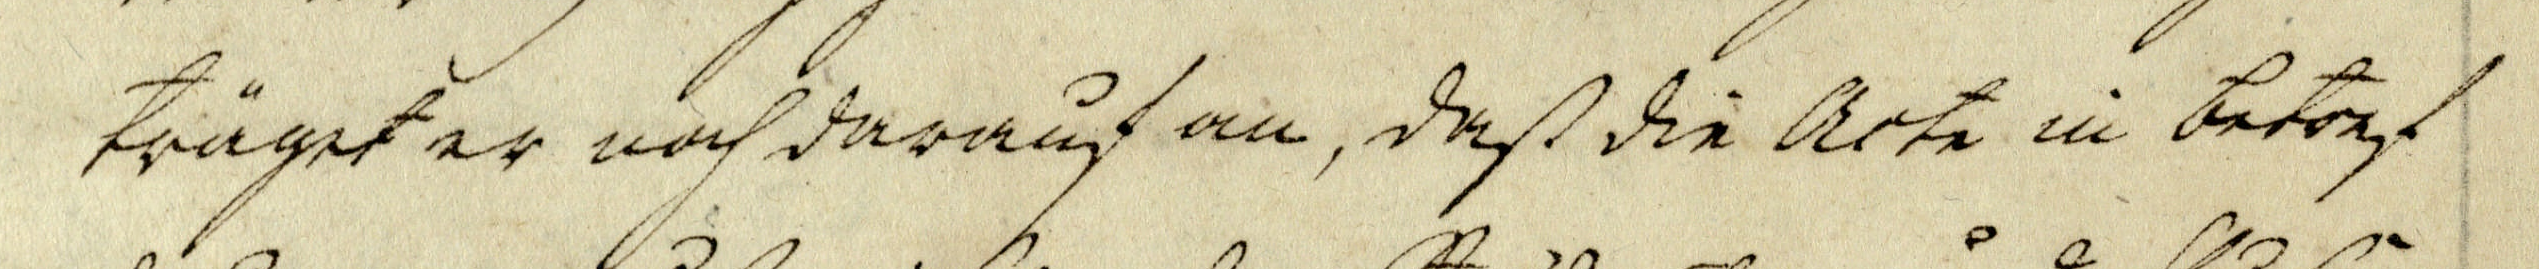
träget er noch darauf an, daß die Acte in Betref
